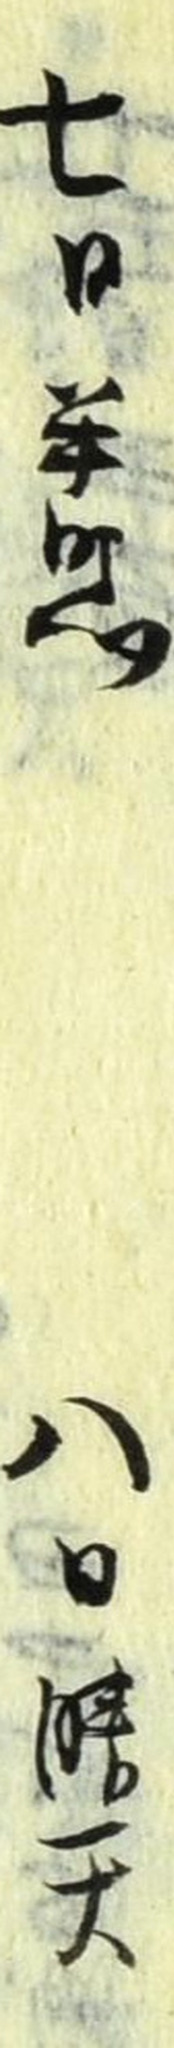七日半照八日晴天
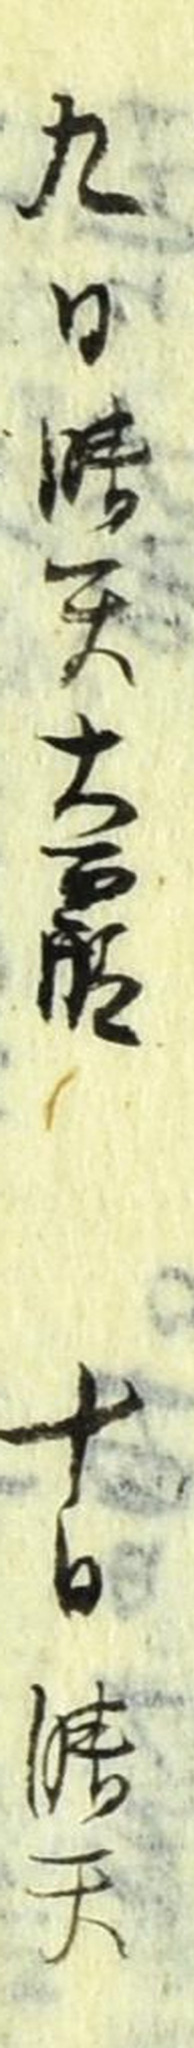九日晴天大霞十日晴天

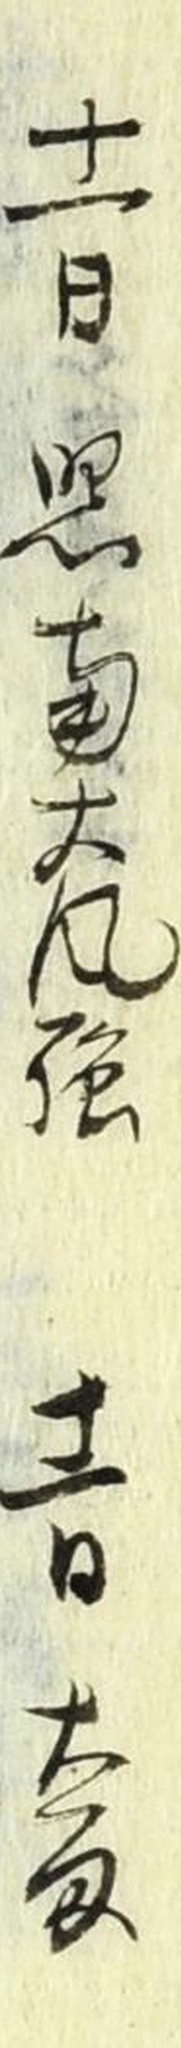十一日照南大風強十二日大雨
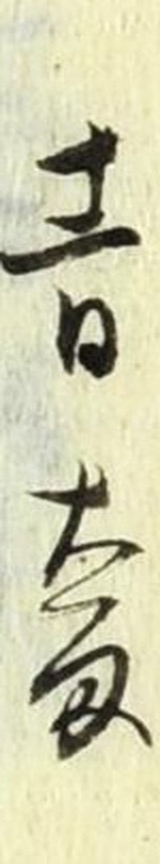廿九日大雨
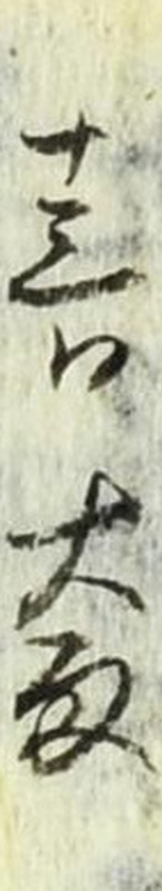廿九日大雨
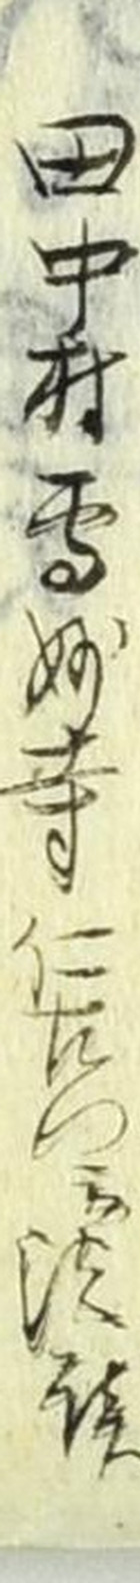田中村専妙寺仁左衛門に而法談
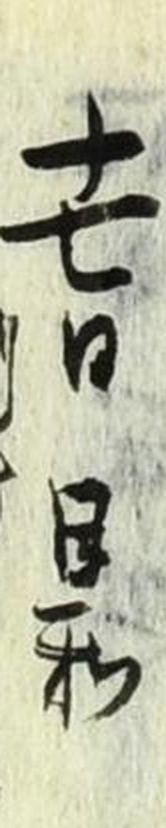十九日日和
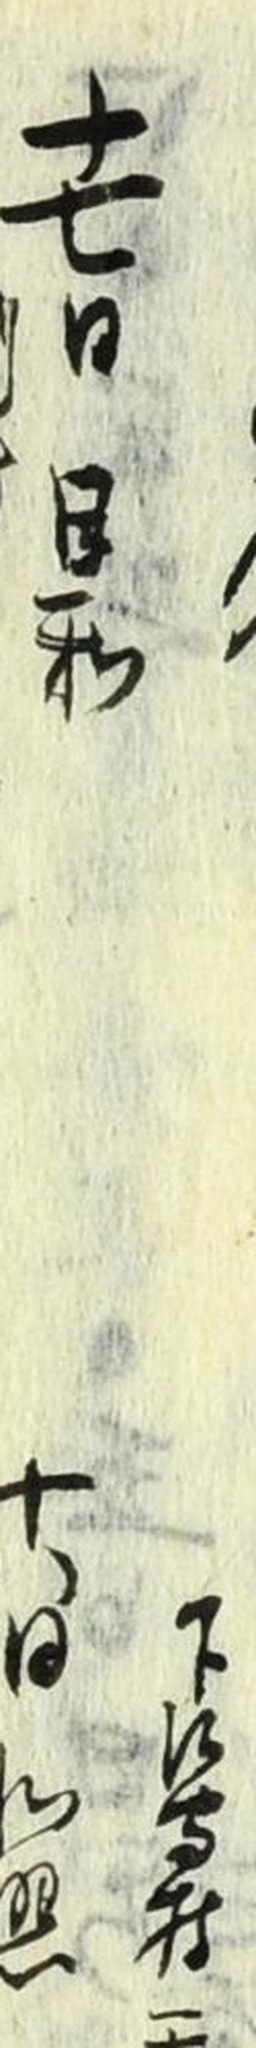十七日日和十八日和照
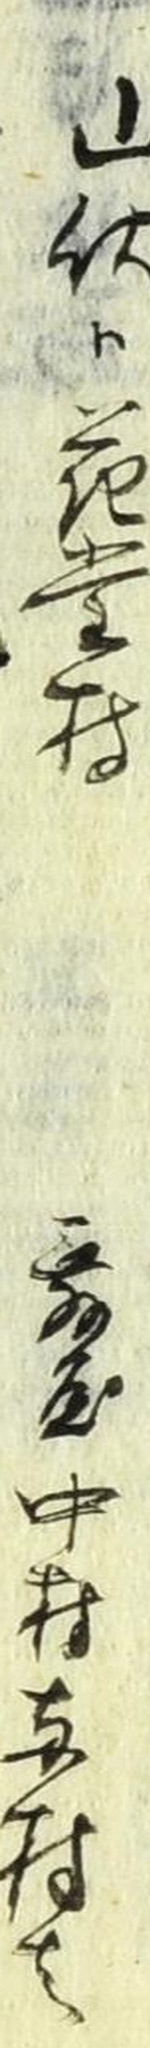山伏と花堂村舞屋中村両村は
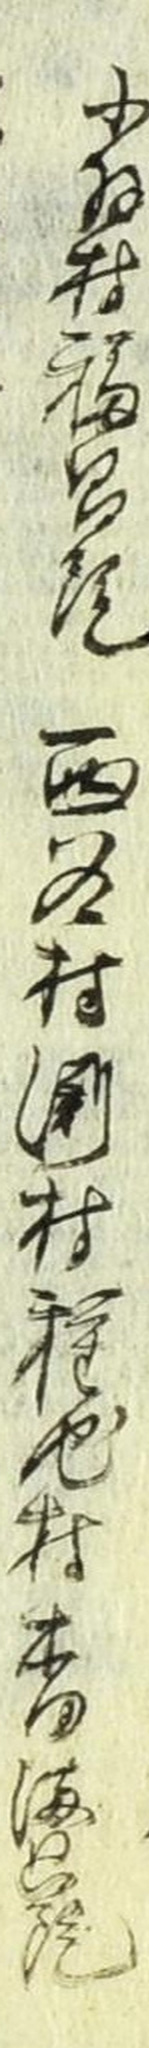小羽村福昌院西谷村淵村種池村木田満昌院
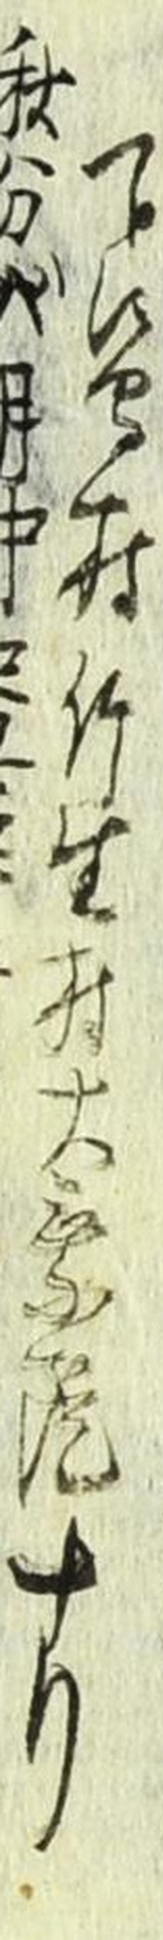下江守村竹生村大乗院なり
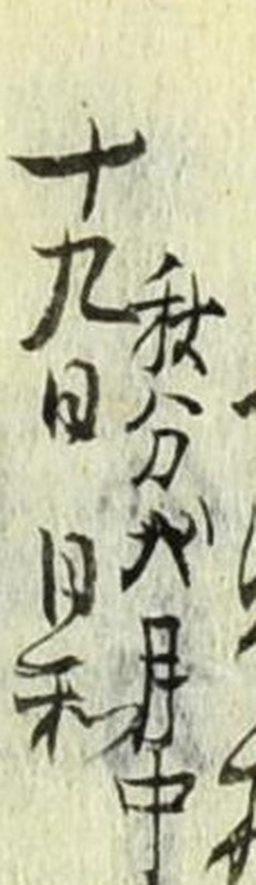十九日日和
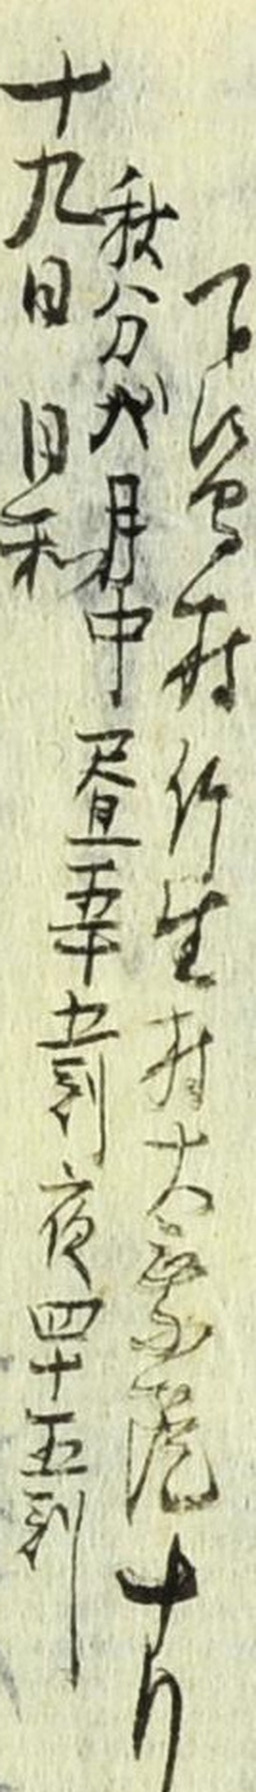秋分八月中昼五十五刻夜四十五刻
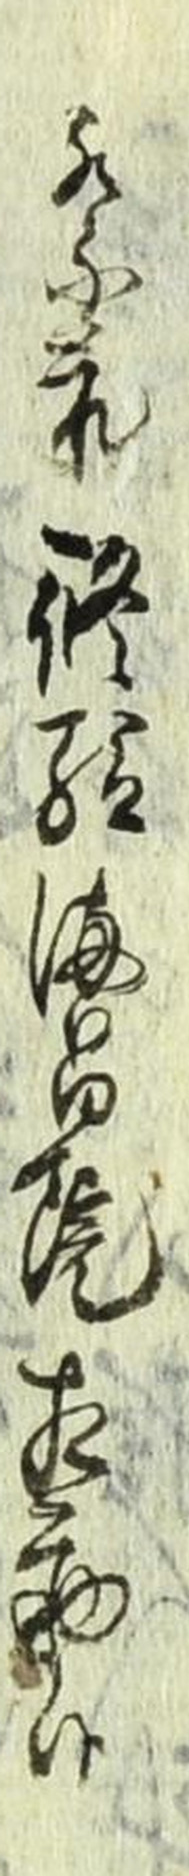祭礼修験満昌院相勤候
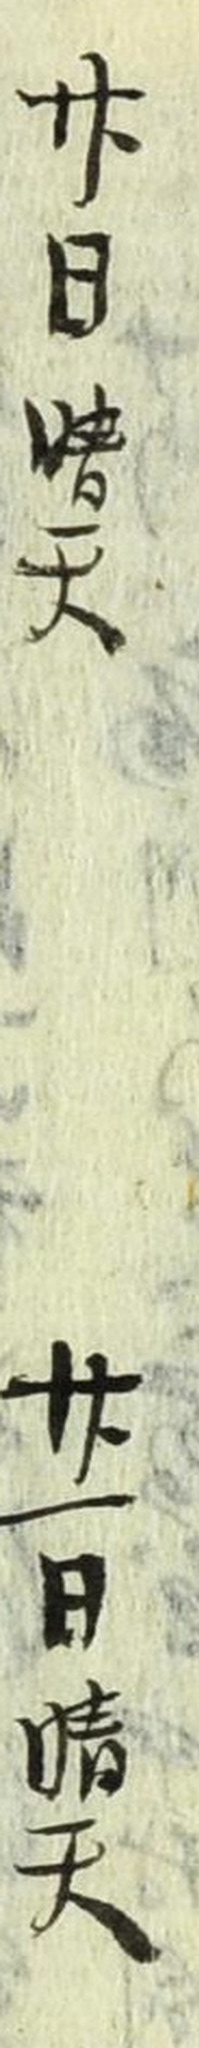廿日晴天廿一日晴天
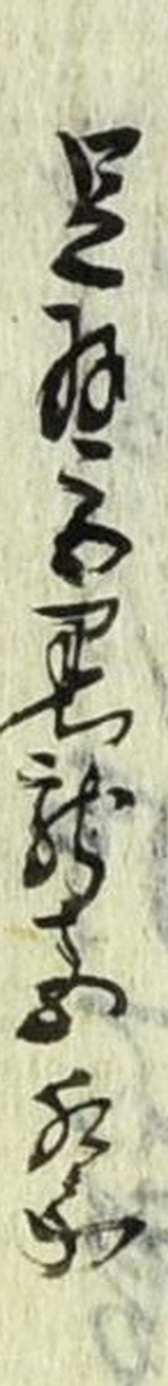足羽宮黒龍宮祭
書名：（日記）
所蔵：福井県文書館 Fukui Prefectural Archives
